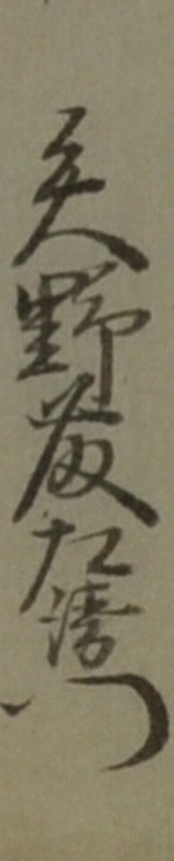矢野藤左衛門
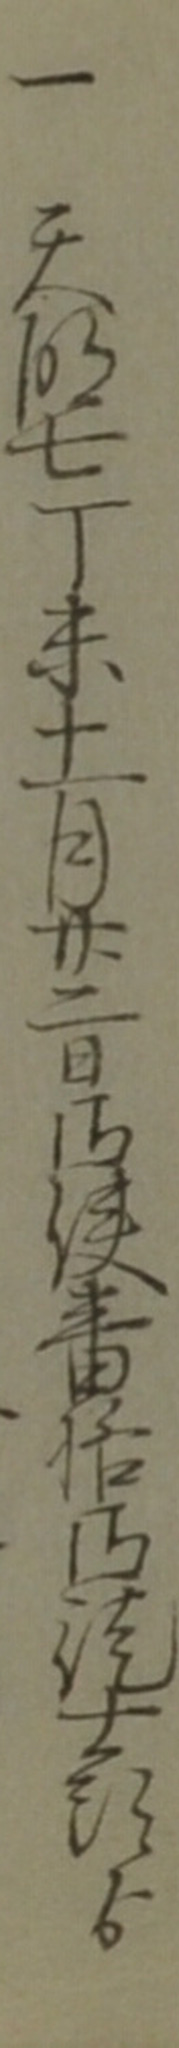一天明七丁未十一月廿二日御使番格御徒士頭ゟ
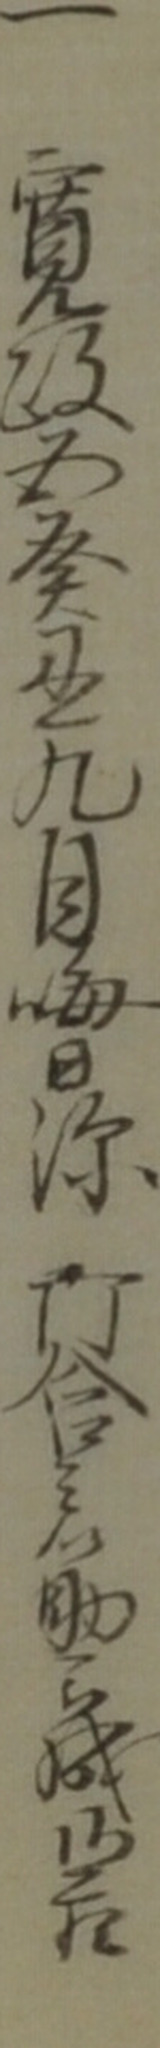一寛政五癸丑九月晦日深御含之筋被成御座
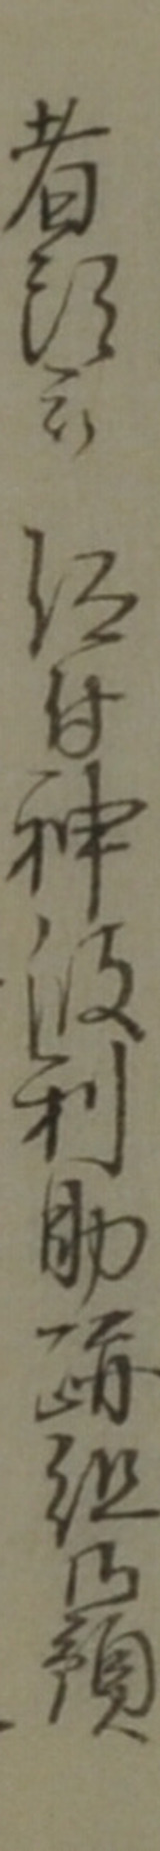者頭被仰付神波利助跡組御預
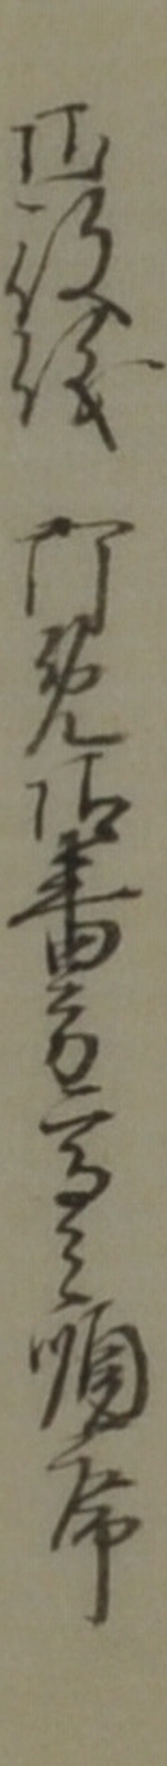御役儀御免御番方高之順席
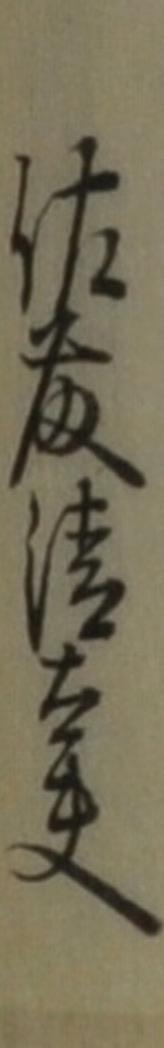佐藤清太夫
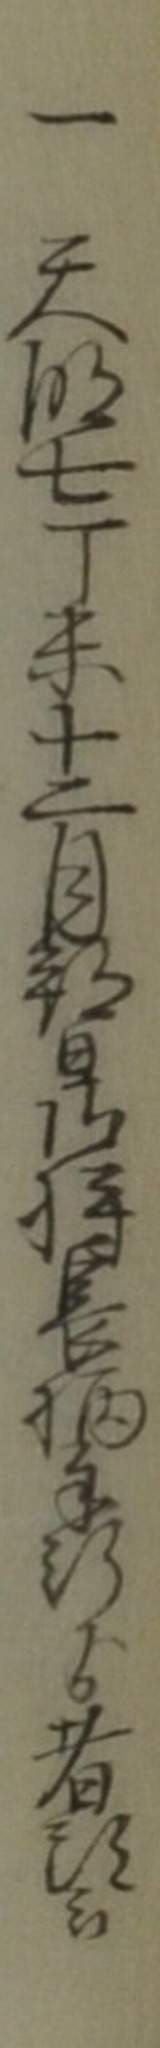一天明七丁未十二月朔日御持長柄奉行ゟ者頭被
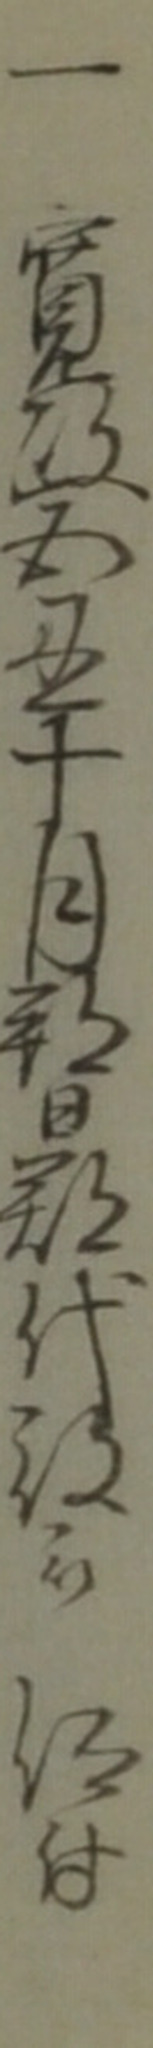一寛政五丑十月朔日郡代役被仰付
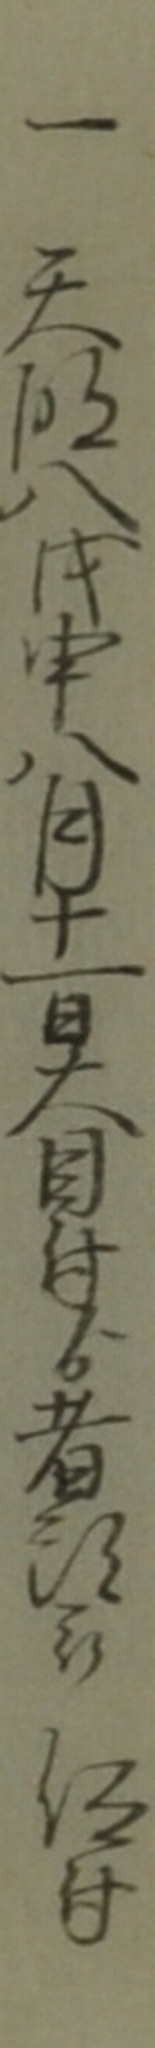一天明八戊申八月十一日大目付ゟ者頭被仰付
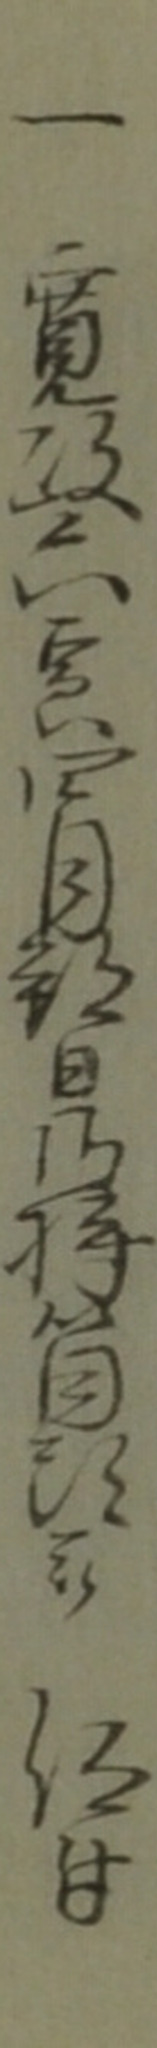一寛政六寅四月朔日御持筒頭被仰付
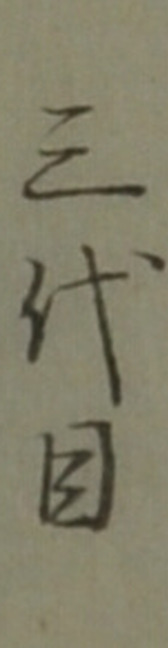三代目
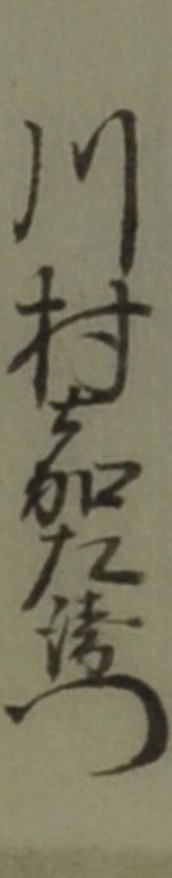川村嘉左衛門
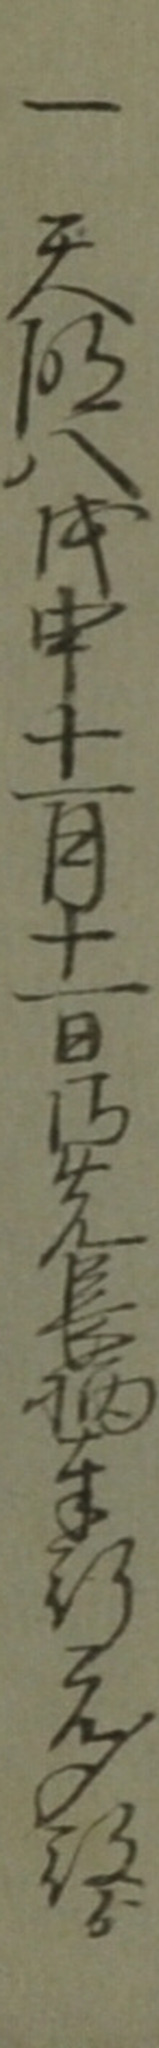一天明八戊申十一月十一日御先長柄奉行元〆役ゟ
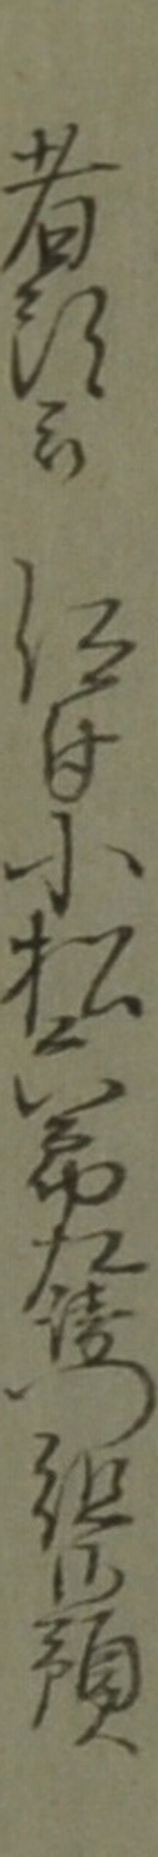者頭被仰付小松六郎左衛門組御預
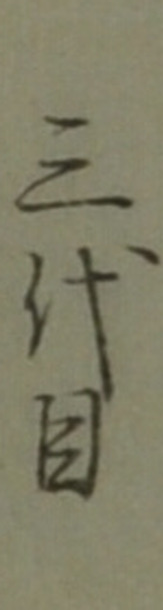三代目
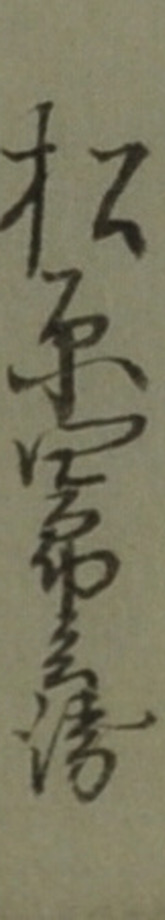松原四郎兵衛
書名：諸御役代々録（二）
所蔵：伊那市立高遠町図書館・合同会社AMANE
